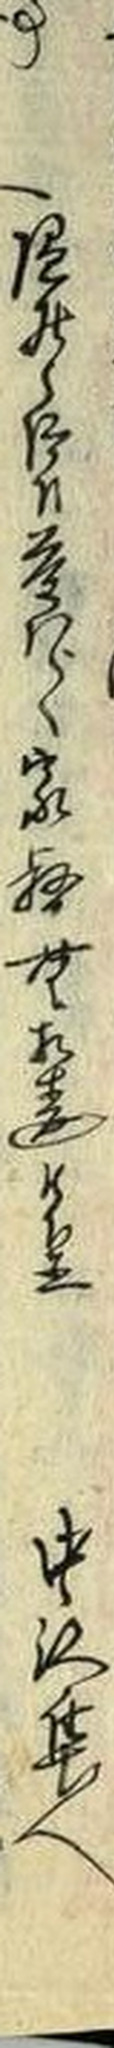隠居被仰付藤八郎へ家督無相違被下置中沢隼人
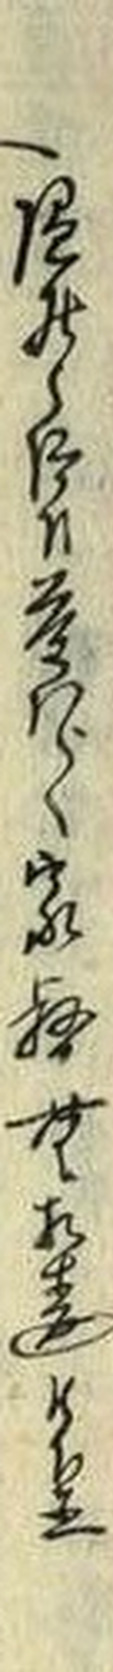隠居被仰付藤八郎へ家督無相違被下置中沢隼人
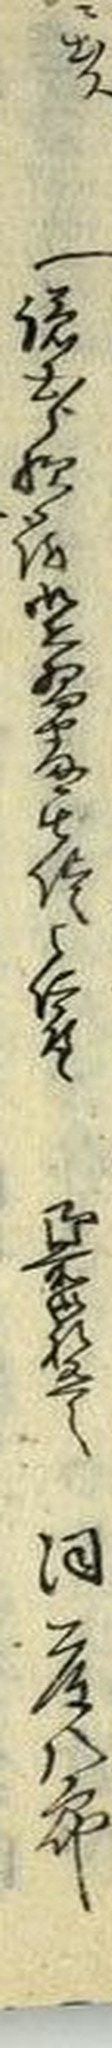謙五郎様御附御近習番其侭被仰付候御前御礼有之同藤八郎
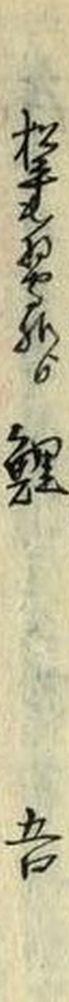松平出羽守様ゟ鯉五口
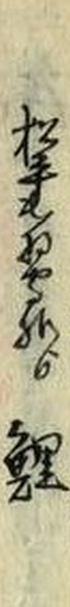松平出羽守様ゟ鯉五口
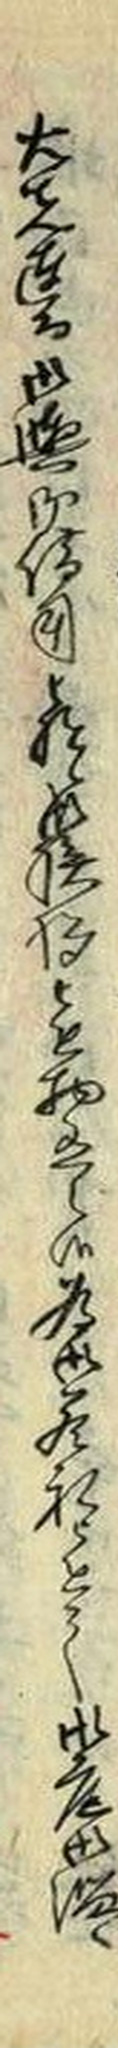右先達而御輿御借用被遊候御挨拶被進物有之候為御答礼被進之御庭御溜へ
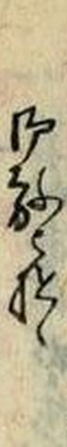御放被遊候
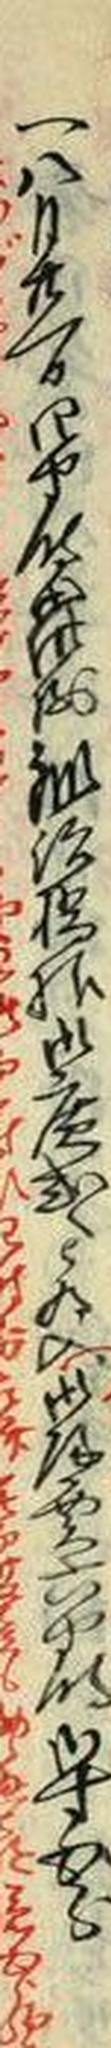一八月廿一日四半時御供揃鍛冶橋様御広式へ被為入御帰殿六半時弐寸五分
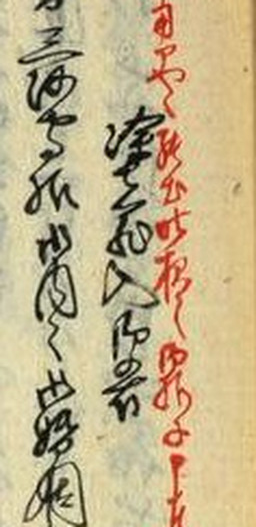塗籠入御肴
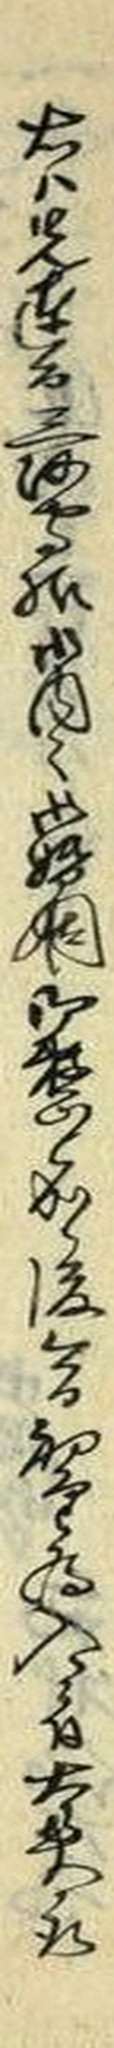右ハ先達而三河守様御内々御婚姻御整被成候後今日初而被為入候ニ付大奥取
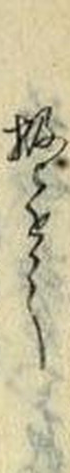扱被進之
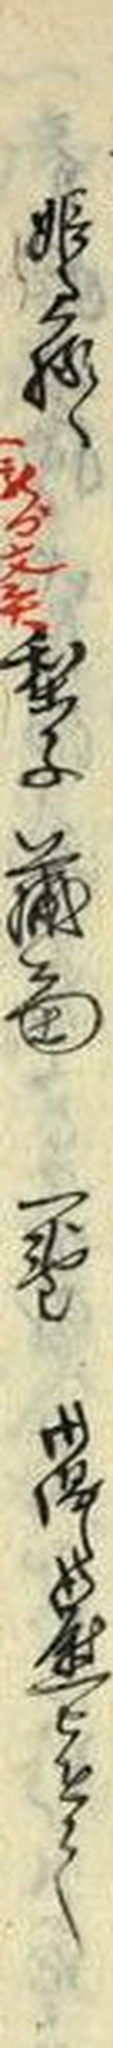姫君様へ梨子葡萄一台御側御慰被進之
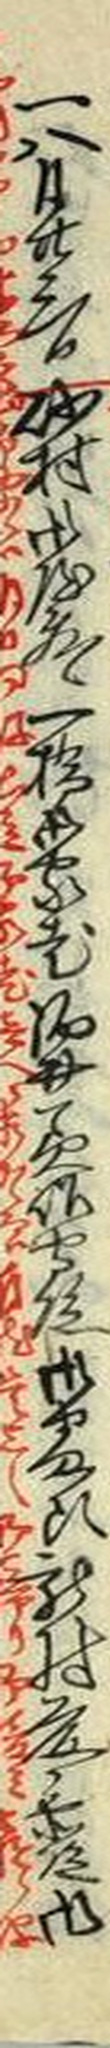一八月廿三日砂村御屋敷一橋御家老酒井美作守殿御番頭新村藤兵衛殿御
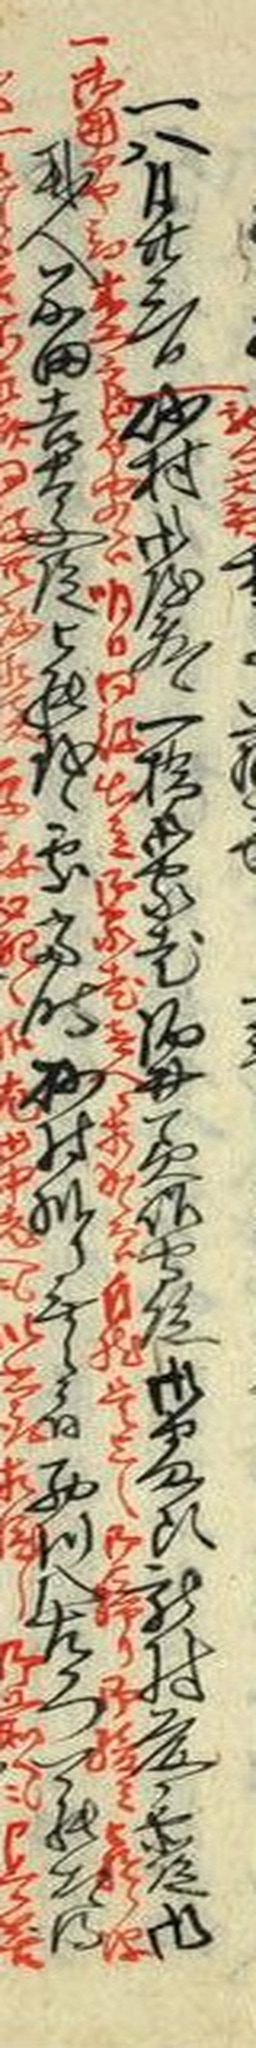用人前田吉太夫殿被罷越候処当時砂村掛り無之候ニ而西川八左衛門罷出候得
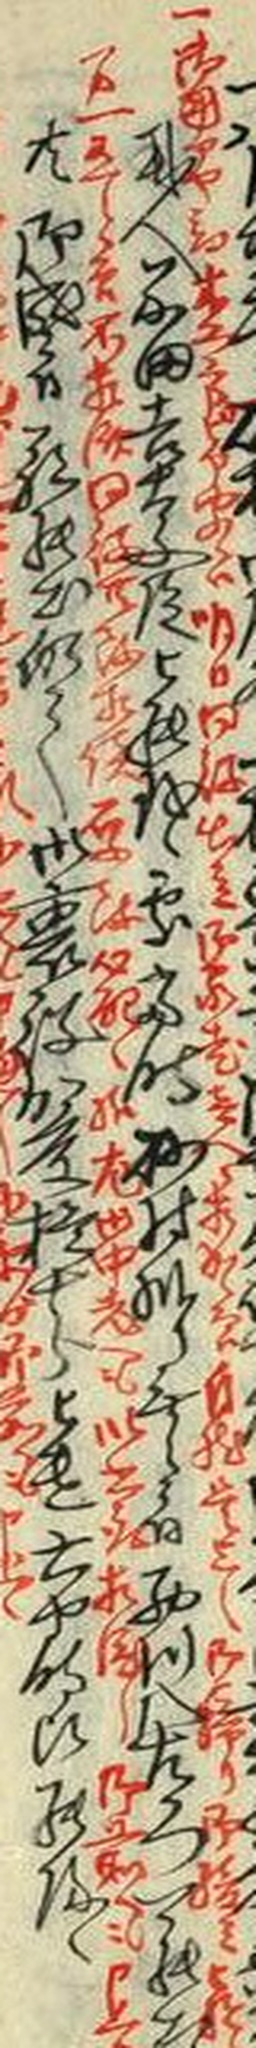共御成ニ付難罷出仍之御裏役加藤権十郎被遣六半時頃罷帰候
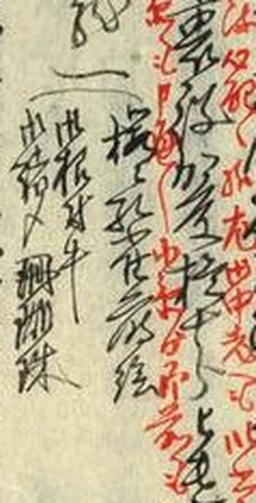桜ニ孔雀蒔絵
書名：少傅日録抄（斉承付側向頭取日記、在府）
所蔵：福井県文書館 Fukui Prefectural Archives
